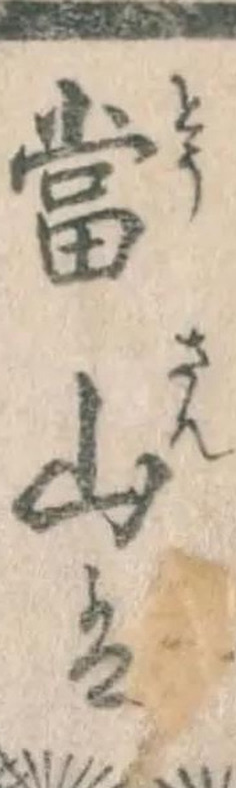当山は
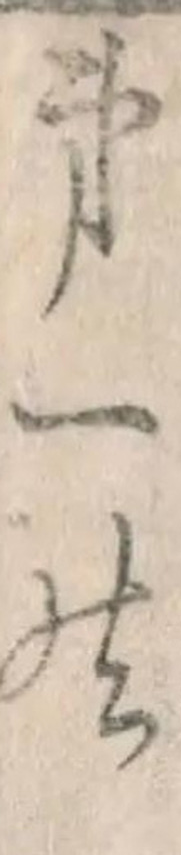第一の
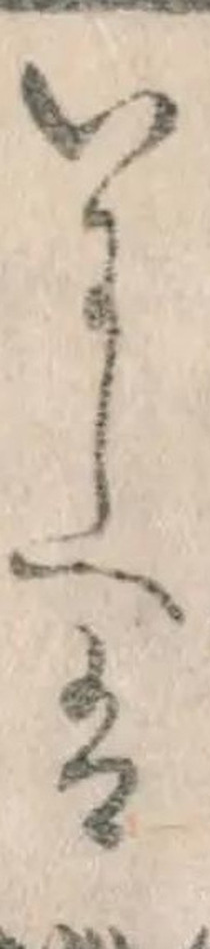いにしへは
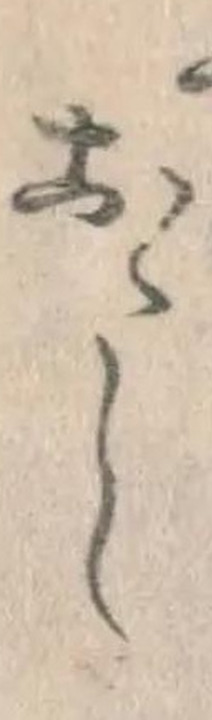おゝく
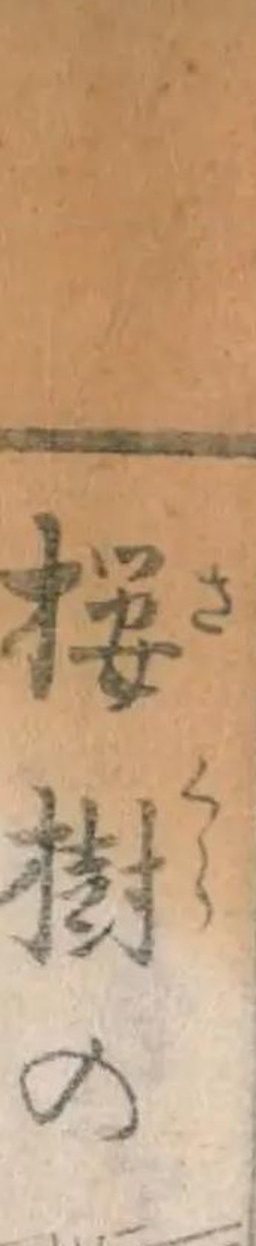桜樹の
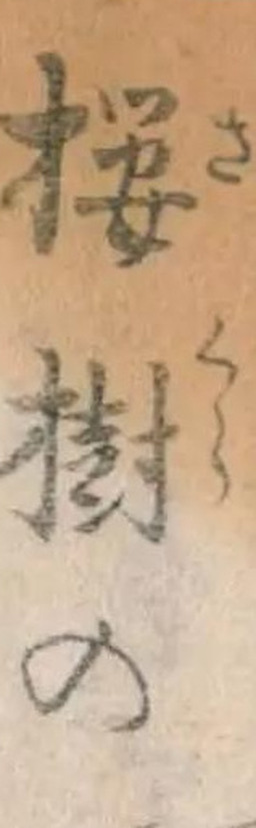桜樹の
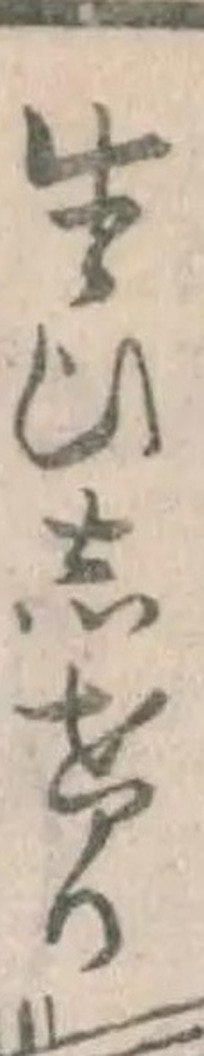生ひしけり
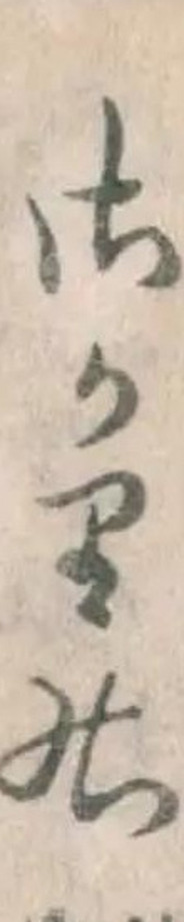御かりの
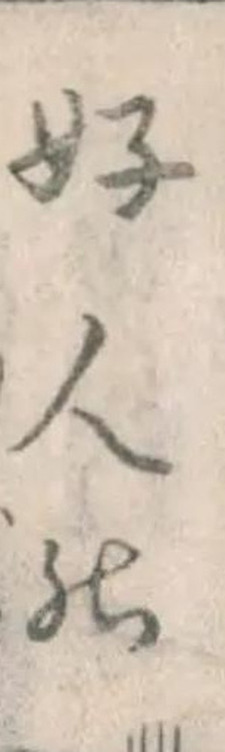好人の
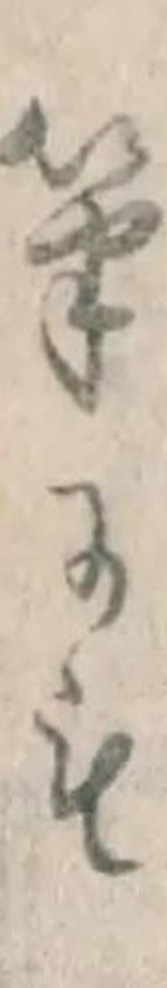筆にも
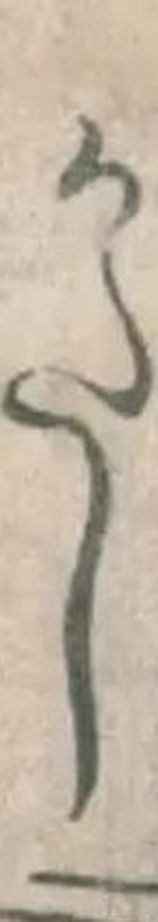かたし

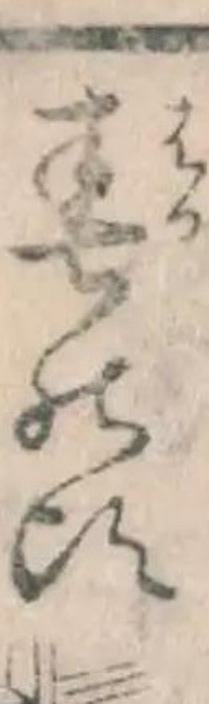春の頃
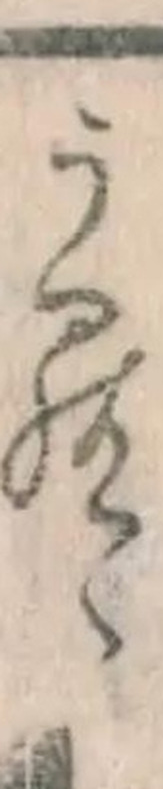うらゝ
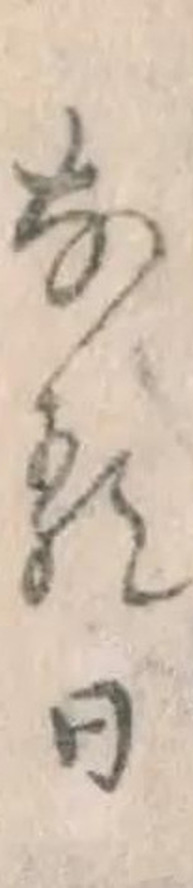なる日
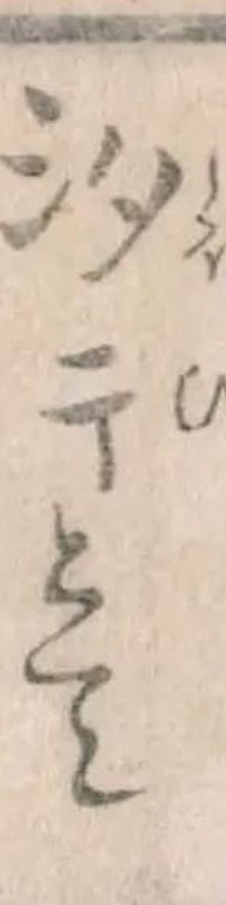汐干とて
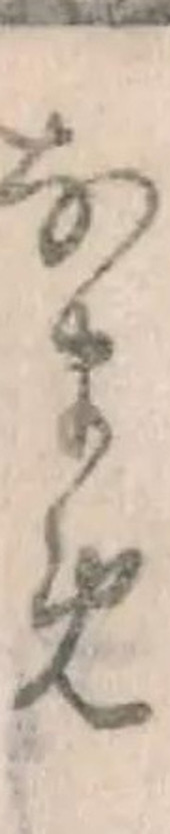なまめ
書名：絵本物見岡
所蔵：国立国会図書館 National Diet Library, JAPAN
